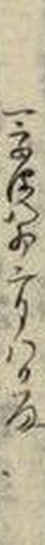一享保八卯二月八日留
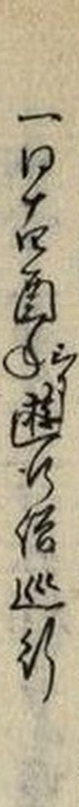一同十四酉年三月遊行僧巡行
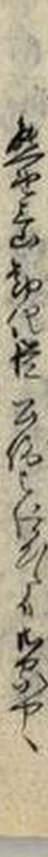熊野三山勧化従公儀被仰出候ニ付御家中へ
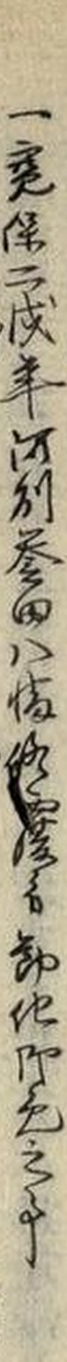一寛保二戌年河州誉田八幡修覆ニ付勧化御免之事
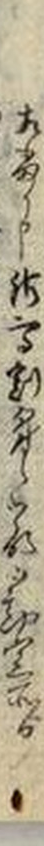相当り申銀高割符之御触御勘定所ゟ
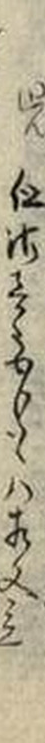廻ル但銀壱匁五歩ツヽ八拾文立
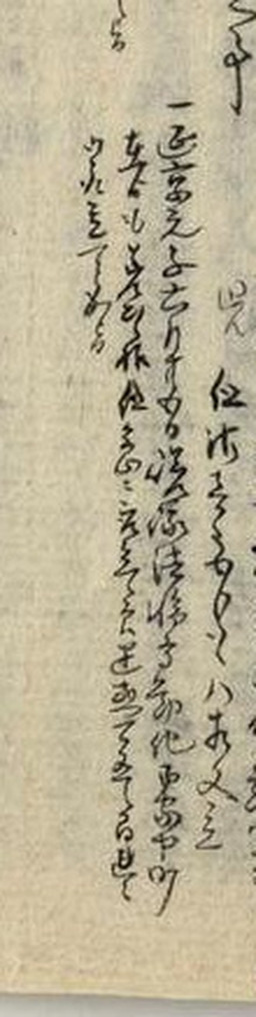在ゟも差出候様但急ニ取立候而ハ迷惑可有之間追々
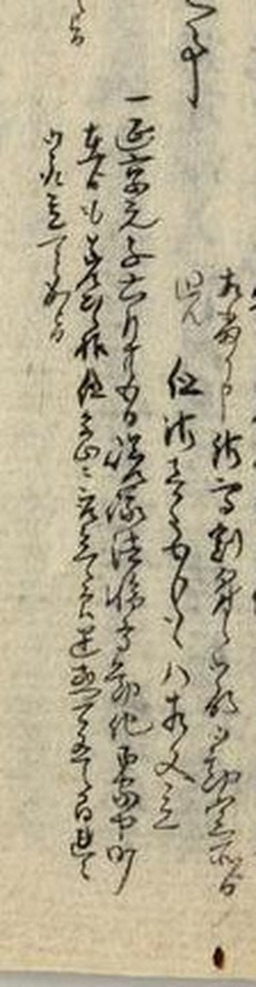一延享元子六月廿五日嵯峨法輪寺勧化御家中町
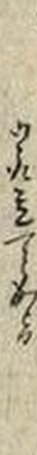御取立可被成旨
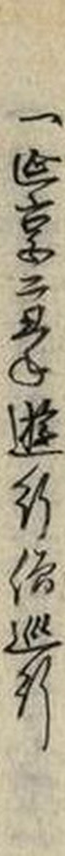一延享二丑年遊行僧巡行
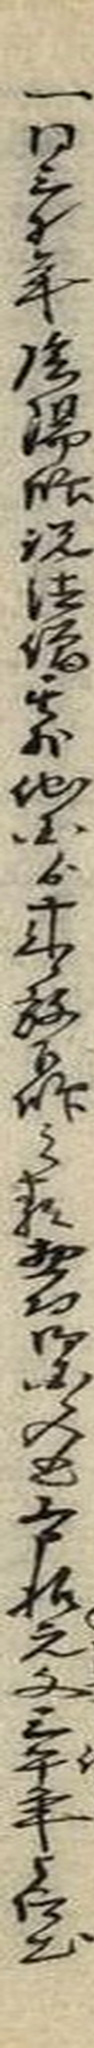一同三寅年陰陽師説法僧其外他国ゟ来候放下師之類惣而御国へ入込不申様元文三午年被仰出〇後一丁ニ記之
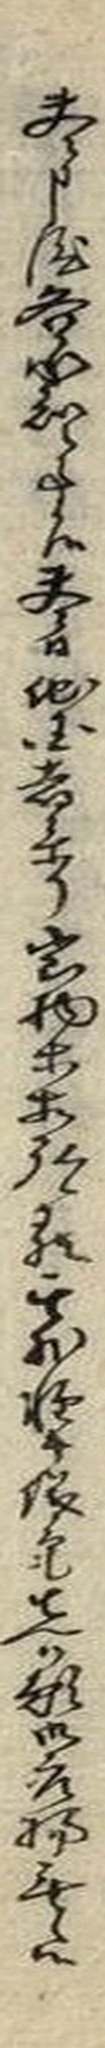夫々申渡各承知候事ニ候夫ニ付他国者参り宝物等相弘候歟其外軽キ儀ニ而も先ハ願御取揚無之候
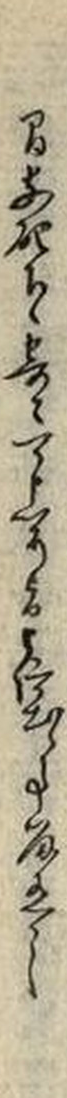間支配下へ寄々可申聞旨被仰出候事留有之
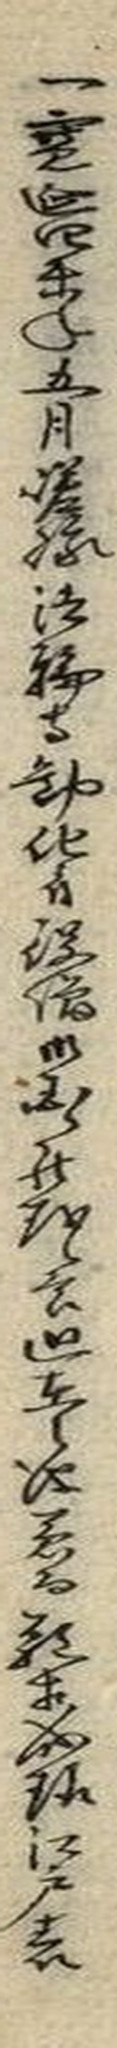一寛延四未年五月嵯峨法輪寺勧化ニ付役僧御国へ罷越候節廻在之儀兼而難相成趣江戸表
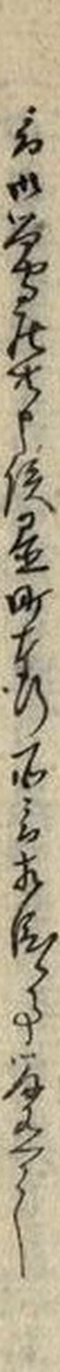ニ而御留守居共申談置町奉行所ニ而相渡候事留有之
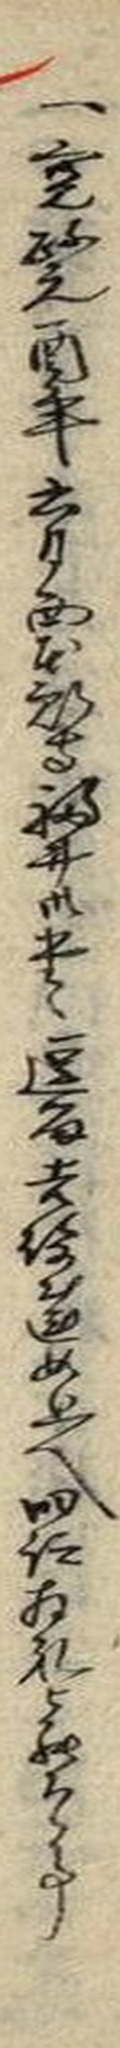一寛政元酉年六月西本願寺福井御堂へ逗留吉崎蓮如上人旧跡拝礼被罷下候事
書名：御国他国諸事之部
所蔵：福井県文書館 Fukui Prefectural Archives
